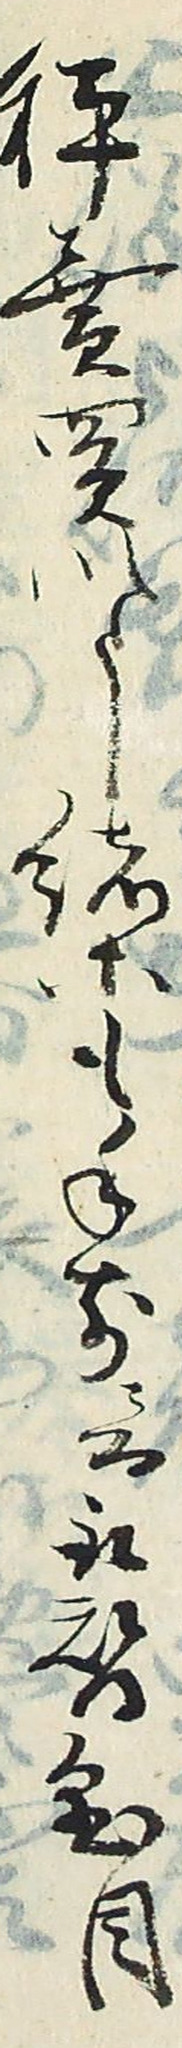秤売買いたし緒等も手前にて取替懸目
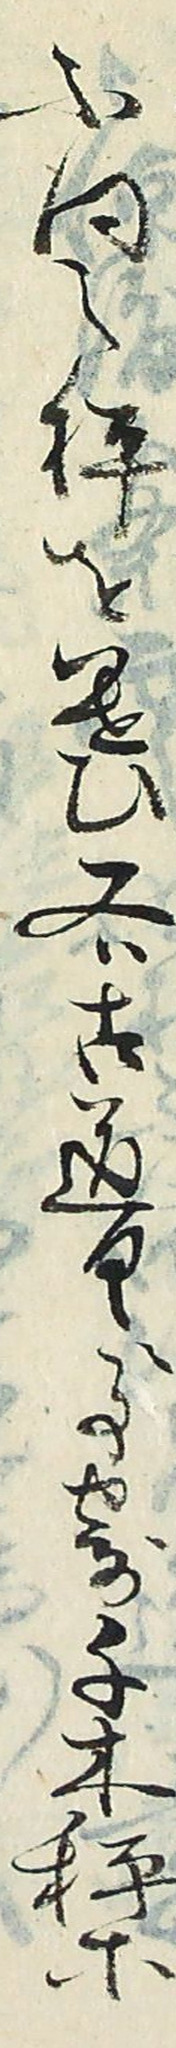不向之秤を遣ひ又は古道具に事寄千木秤等
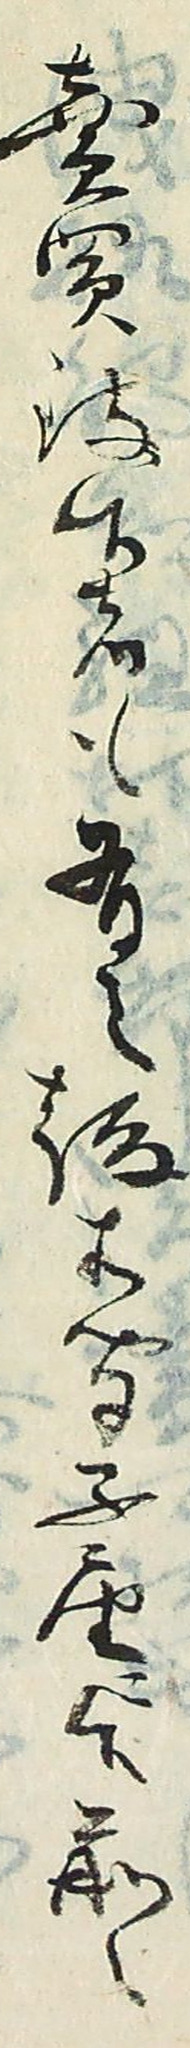売買致候者も有之趣相聞不届に候前々
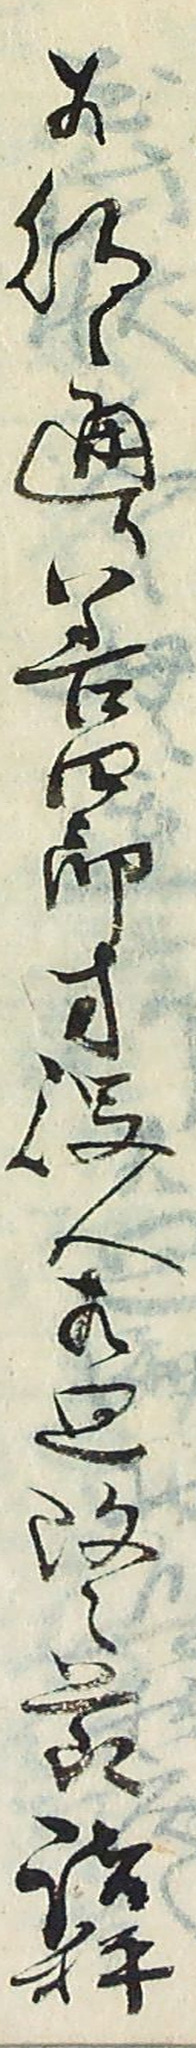相触候通り善四郎方役人相廻改之節諸秤
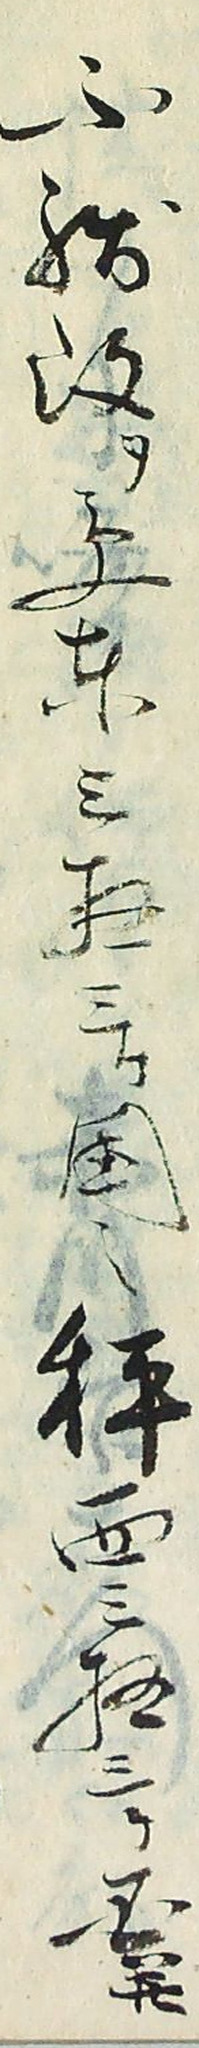不残改を受東三拾三ケ国之秤西三拾三ケ国幷
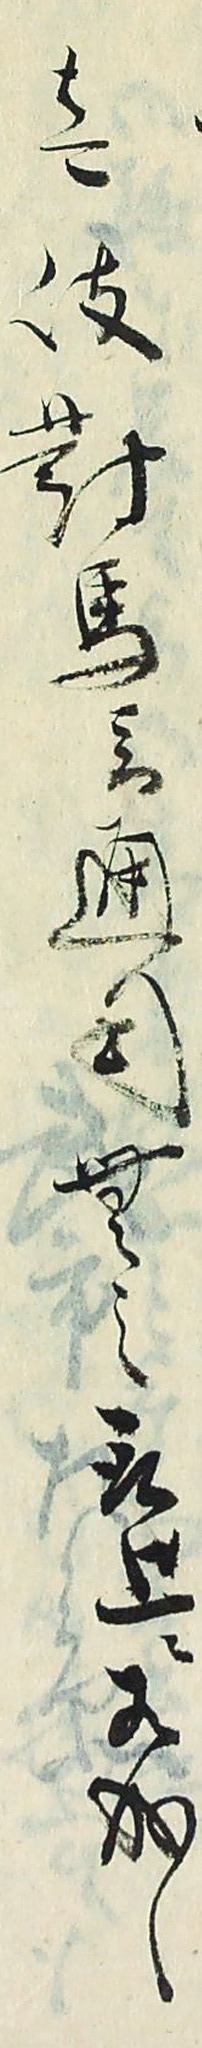壱岐対馬に而通用無之取上に相成候
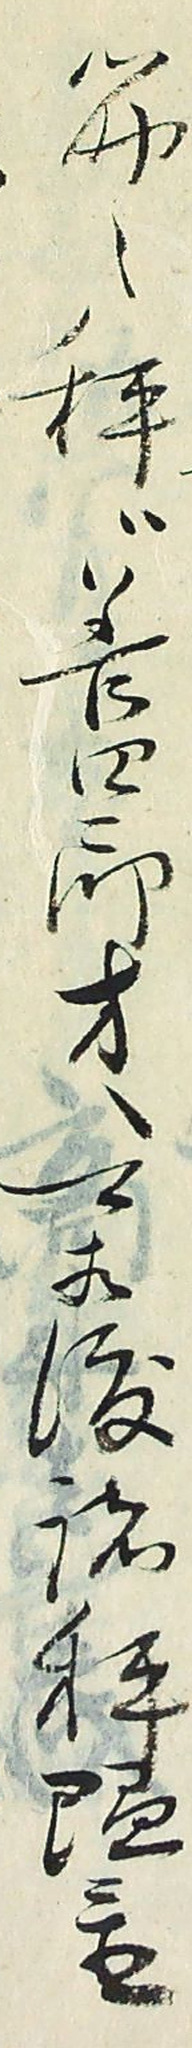筋之秤は善四郎方へ可相渡諸秤隠置
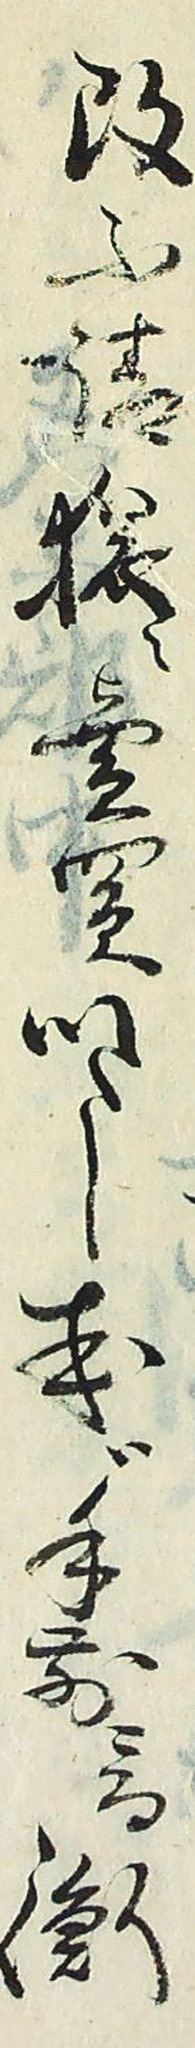改不請猥に売買致し或は手前に而衡
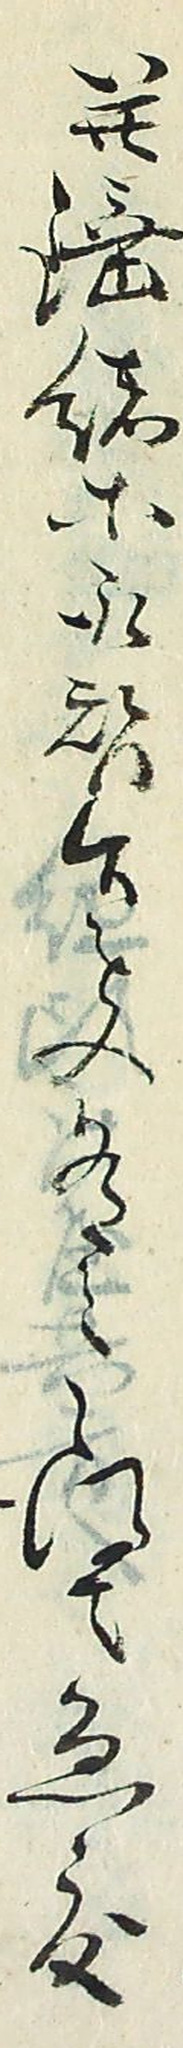幷錘緒等取替候もの有之候得者急度
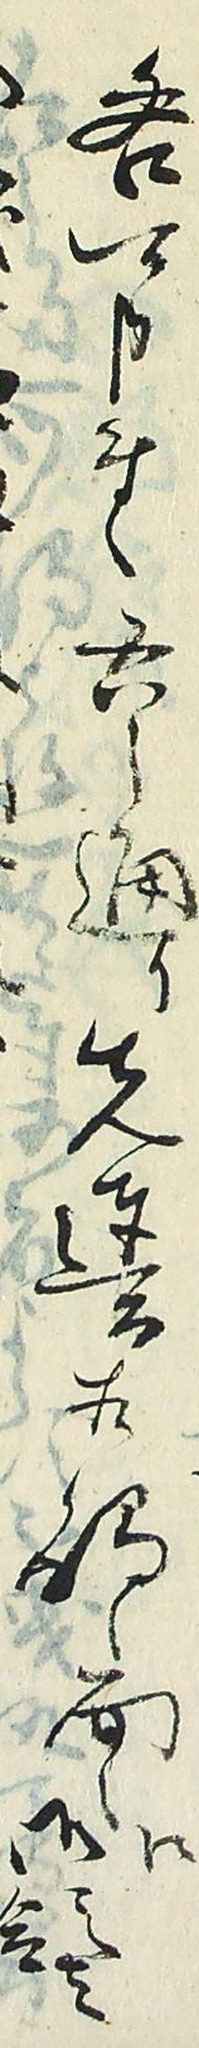咎可申付候右之通り先達而相触候面々江御領は
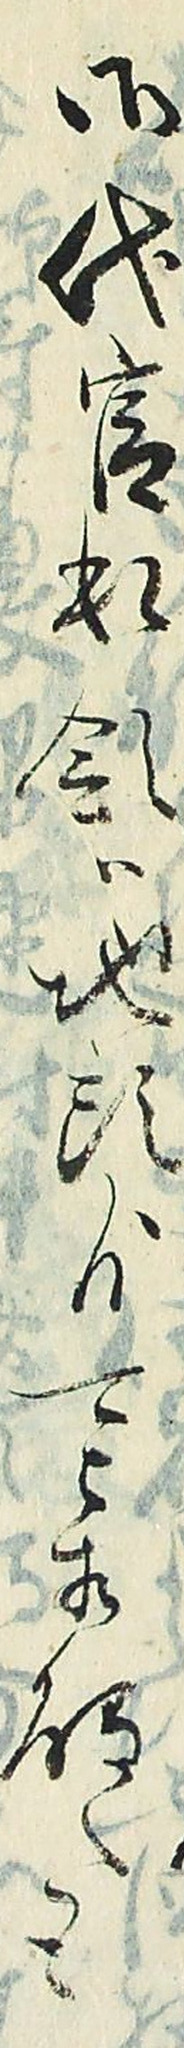御代官私領は地頭ゟ可被相触候以上
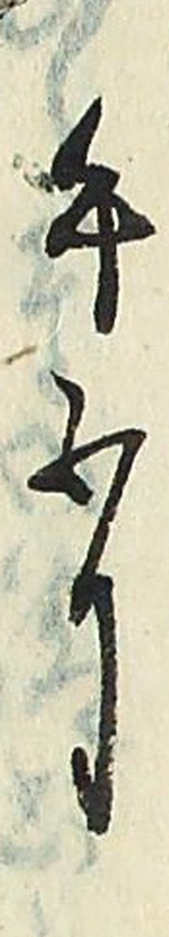午五月
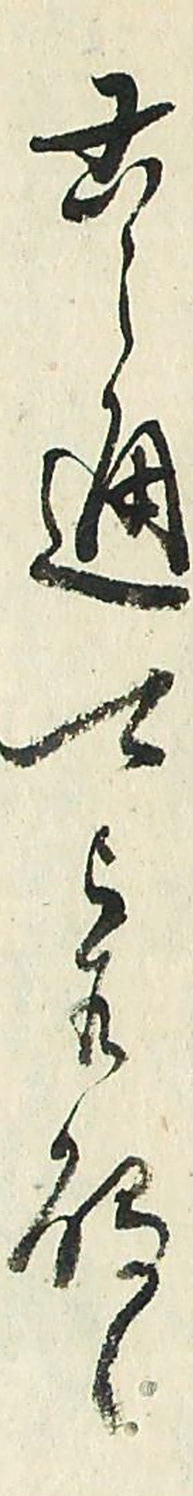右之通可被相触候

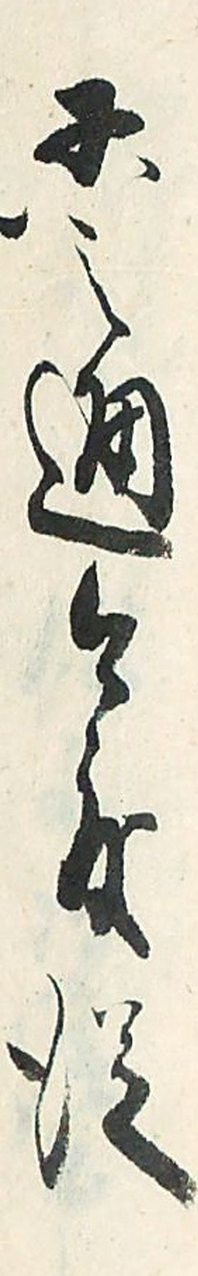右之通今度従
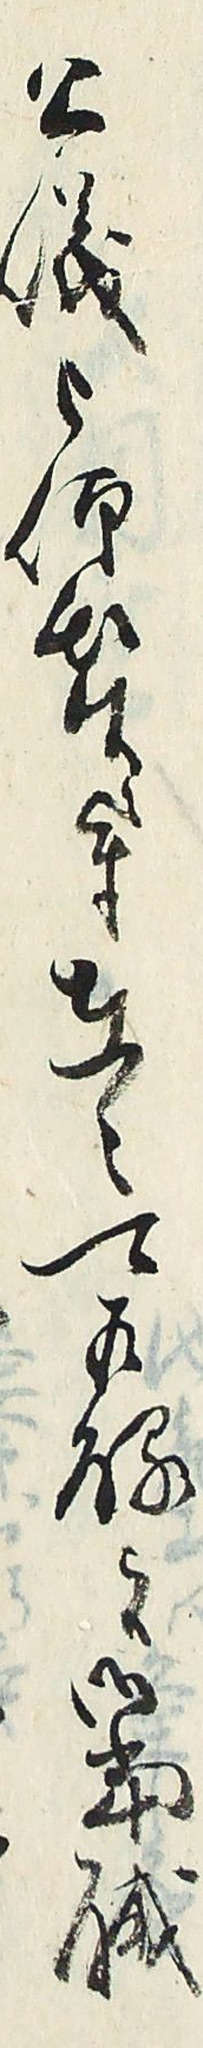公儀被仰出候に付在々可相触旨御当職
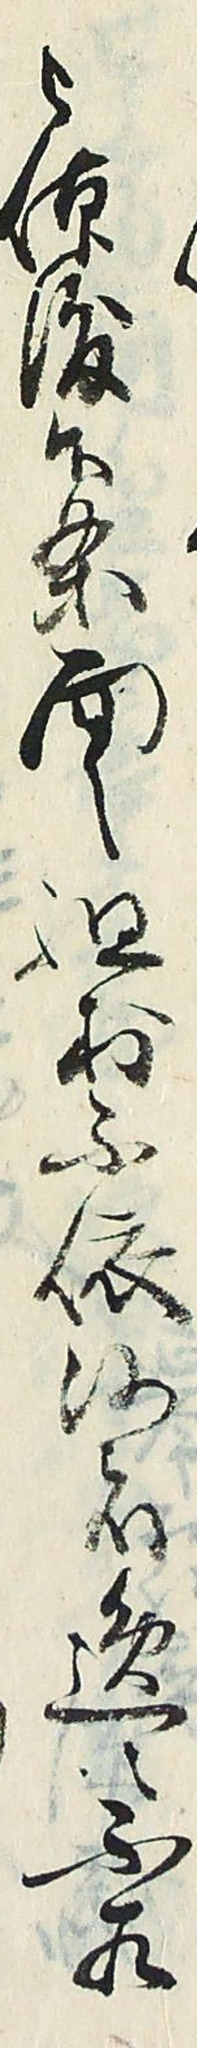被仰渡候条面々組村不依何者逸々不相
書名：諸御用御□受書控
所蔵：鳴門教育大学 Naruto University of Education
